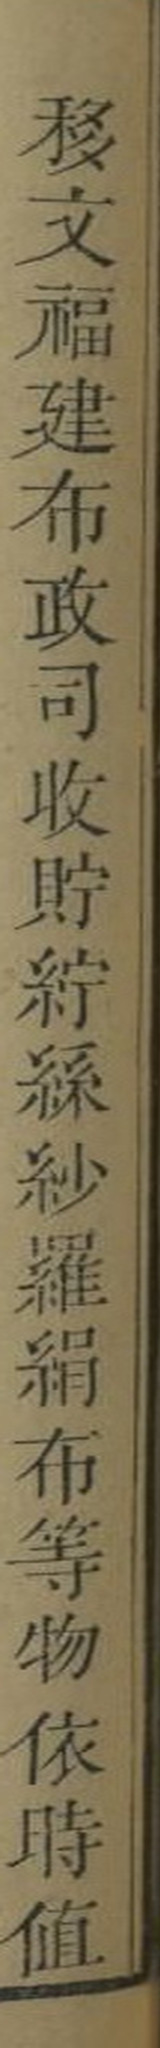移文福建布政司収貯紵糸紗羅絹布等物依時値
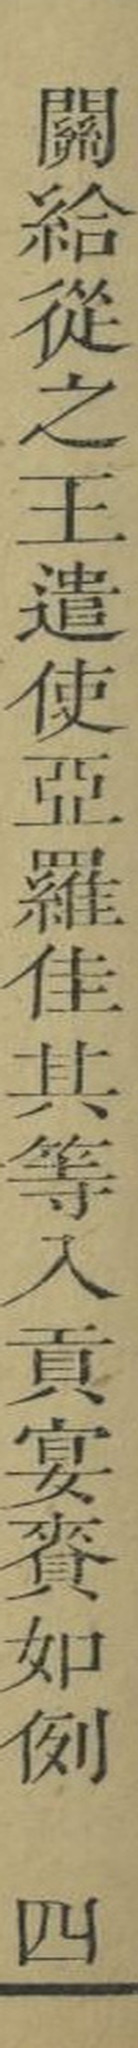関給従之王遣使亜羅佳其等入貢宴賚如例四
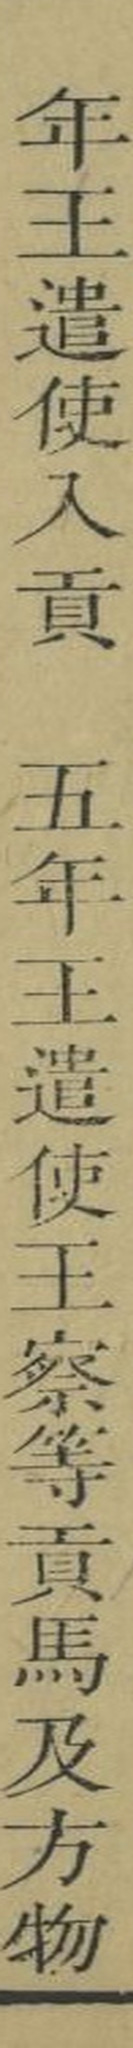年王遣使入貢五年王遣使王察等貢馬及方物
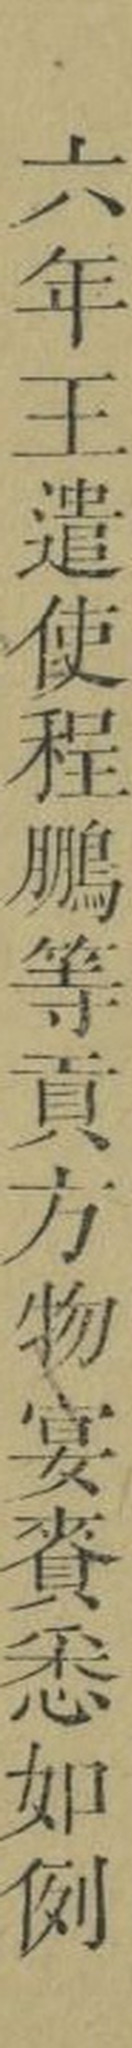六年王遣使程鵬等貢方物宴賚悉如例
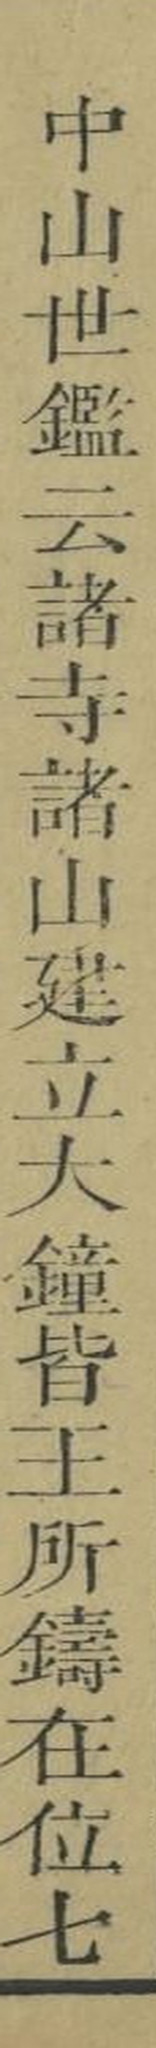中山世鑑云諸寺諸山建立大鐘皆王所鋳在位七
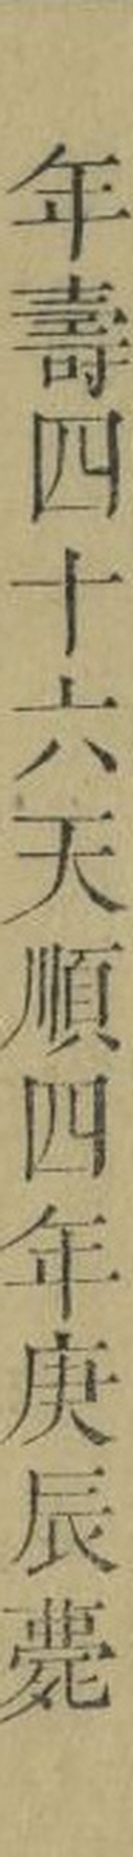年寿四十六天順四年庚辰薨
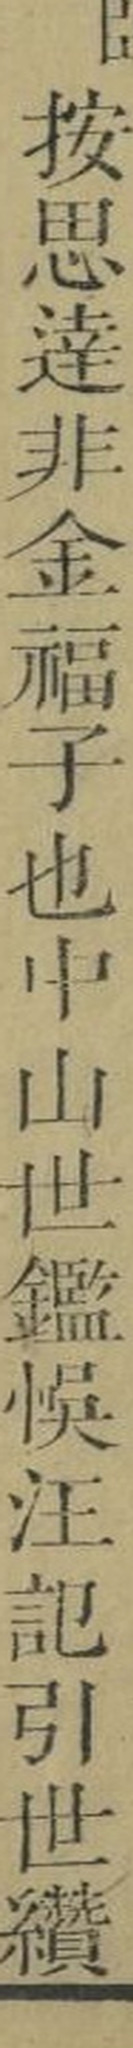臣按思達非金福子也中山世鑑悞汪記引世纘
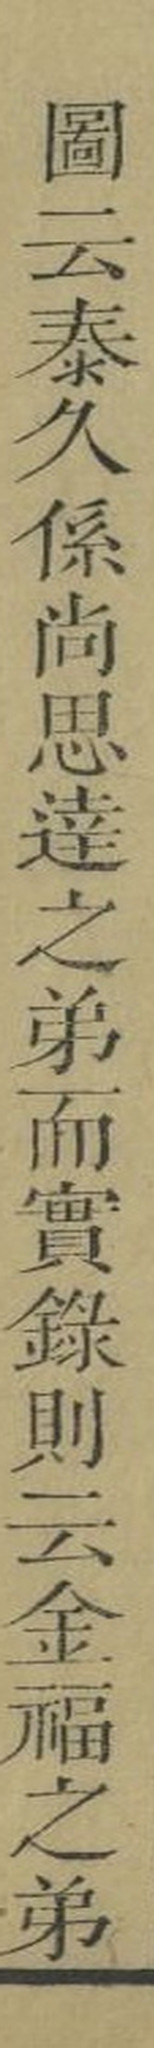図云泰久係尚思達之弟而実録則云金福之弟
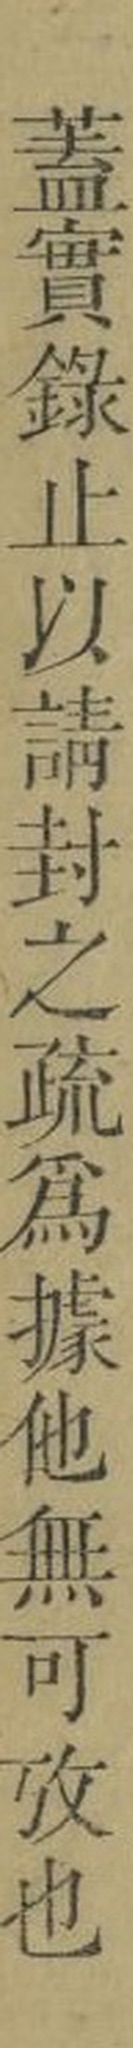蓋実録止以請封之疏為拠他無可攷也

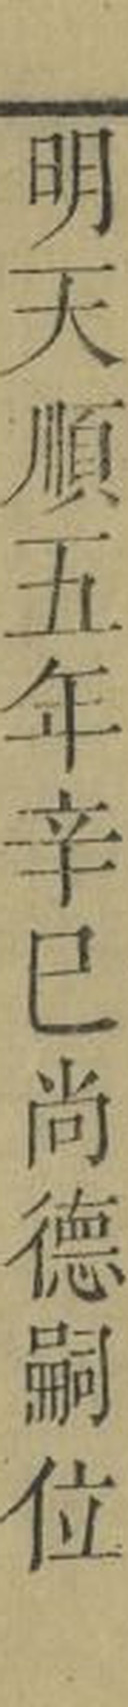明天順五年辛巳尚徳嗣位
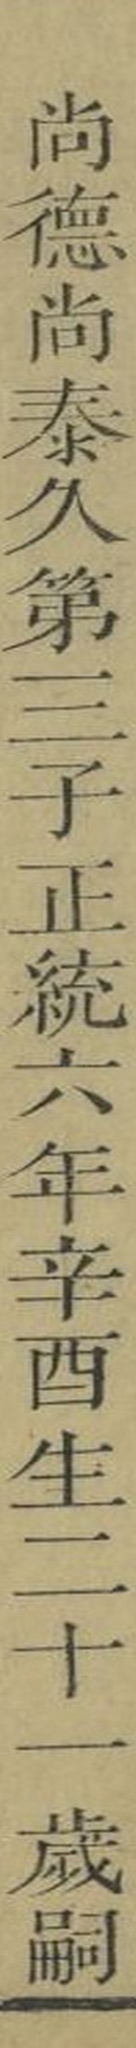尚徳尚泰久第三子正統六年辛酉生二十一歳嗣
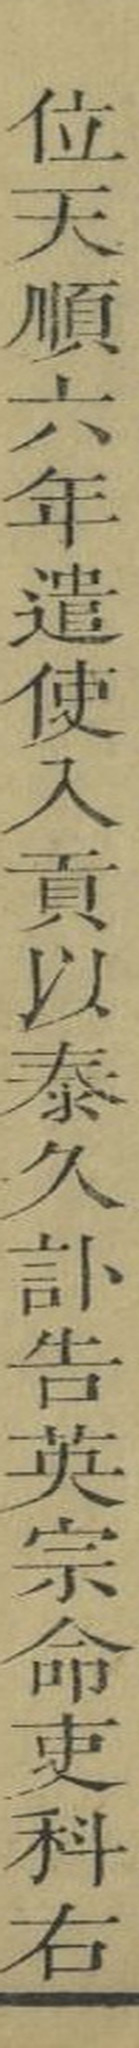位天順六年遣使入貢以泰久訃告英宗命吏科右
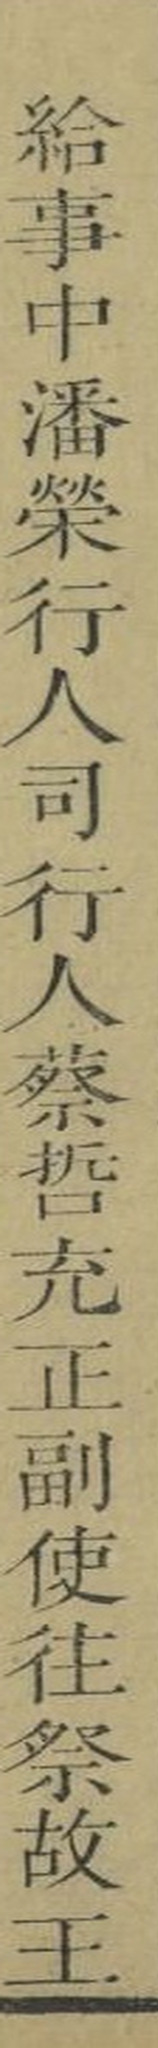給事中潘栄行人司行人蔡哲充正副使往祭故王
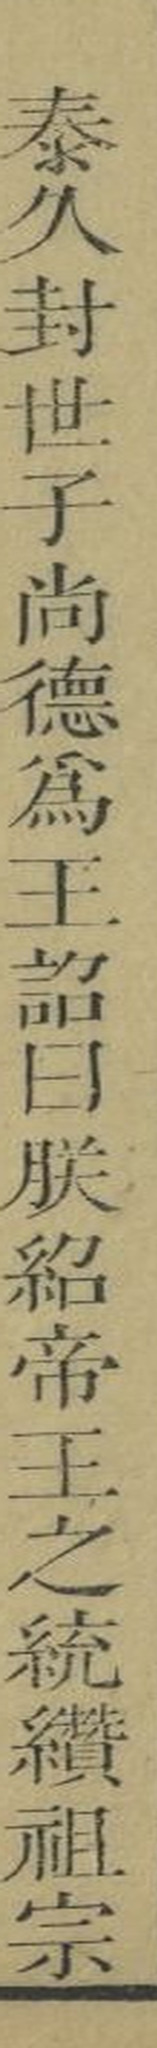泰久封世子尚徳為王詔曰朕紹帝王之統纘祖宗
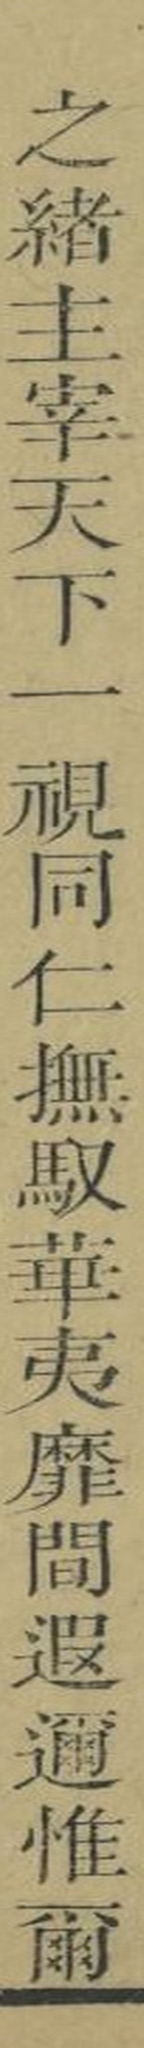之緒主宰天下一視同仁撫馭華夷靡間遐邇惟爾
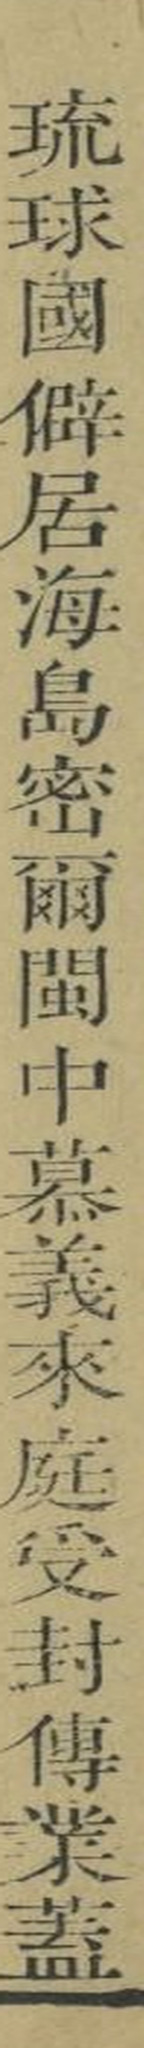琉球国僻居海島密爾閩中慕義来庭受封伝業蓋
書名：中山伝信録 巻三
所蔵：University of the Ryukyus Library
